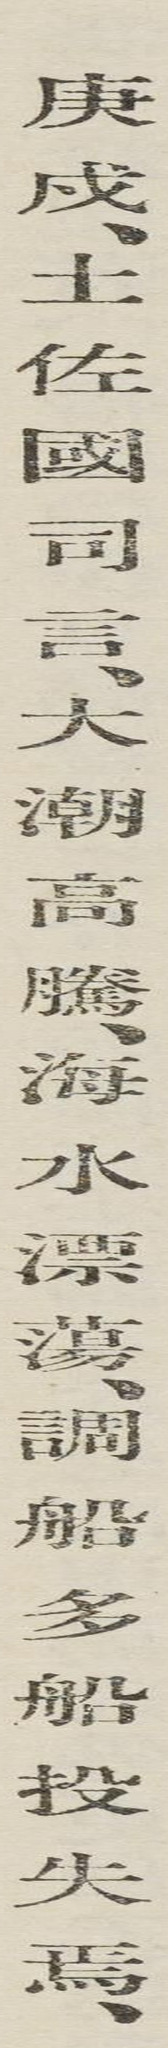庚戌、土佐国司言、大潮高騰、海水漂蕩、調船多船投失焉、
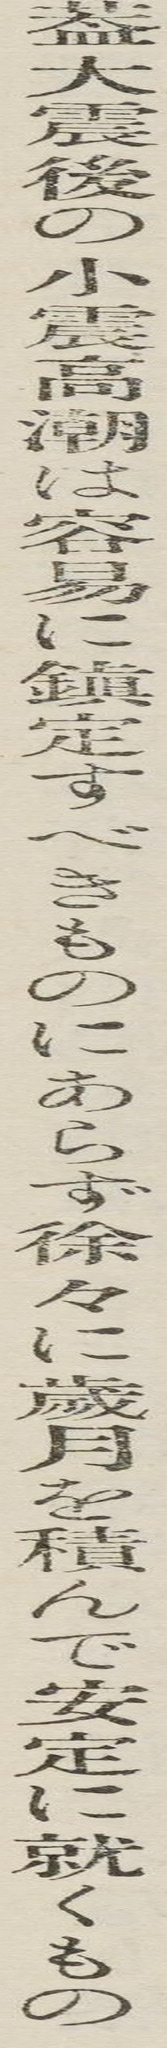蓋大震後の小震高潮は容易に鎮定すべきものにあらず徐々に歳月を積んで安定に就くもの
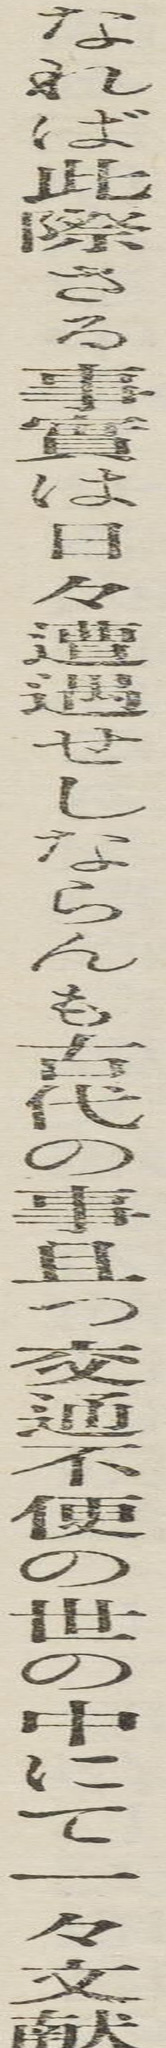なれば此際さる事実は日々遭遇せしならんも古代の事且つ交通不便の世の中にて一々文献
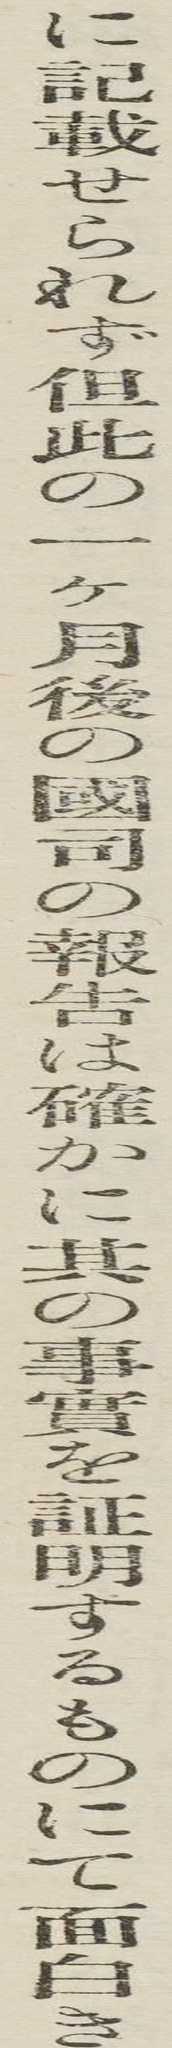に記載せられず但此の一ヶ月後の国司の報告は確かに其の事実を証明するものにて面白き
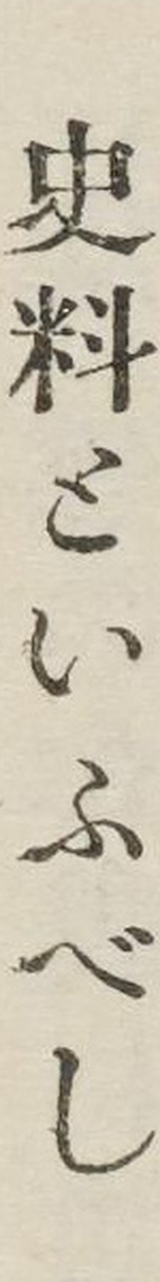史料といふべき
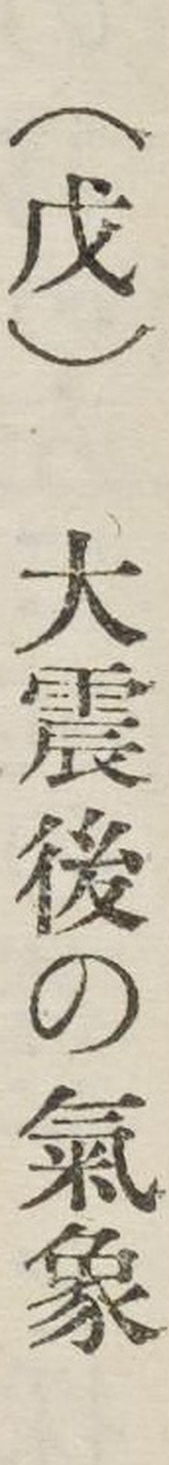大震後の気象
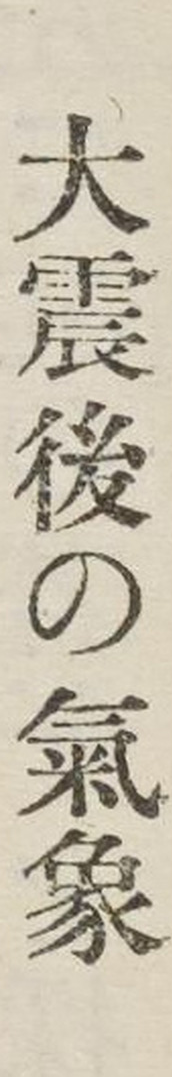大震後の気象
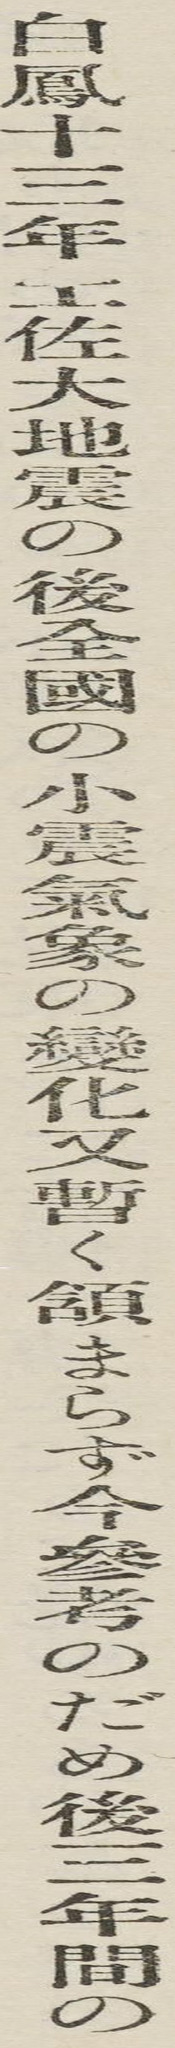白鳳十三年土佐大地震の後全国の小震気象の変化又暫く頷まらず今参考のため後三年間の
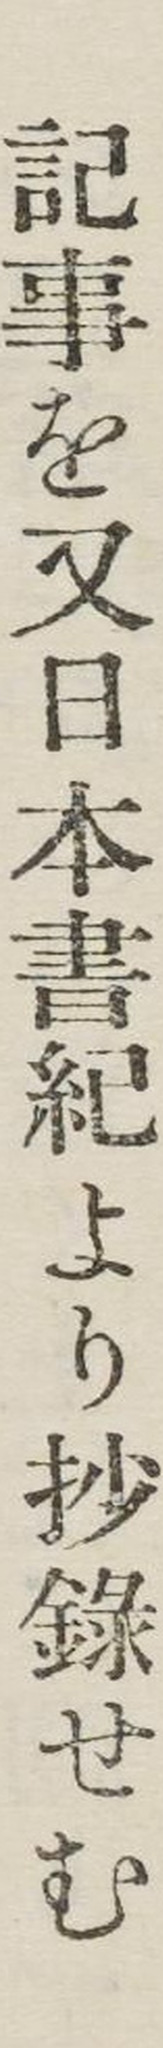記事を又日本書紀より抄録せむ
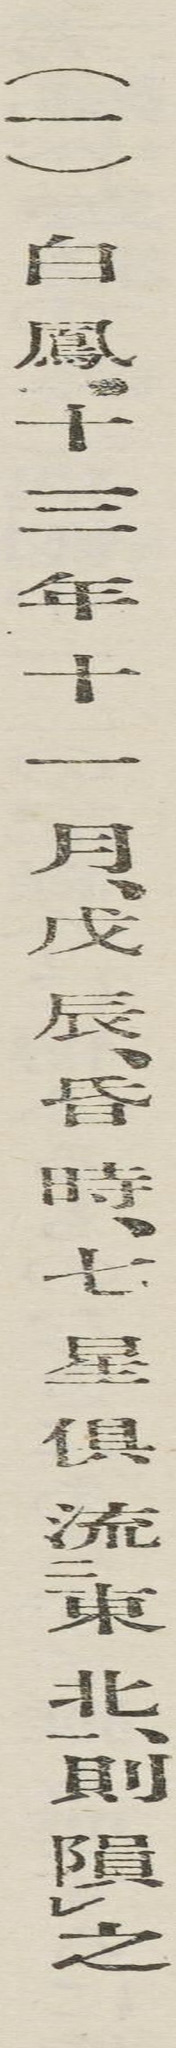白鳳十三年百十一月、戊辰、昏時、七星倶流東北、則隕之
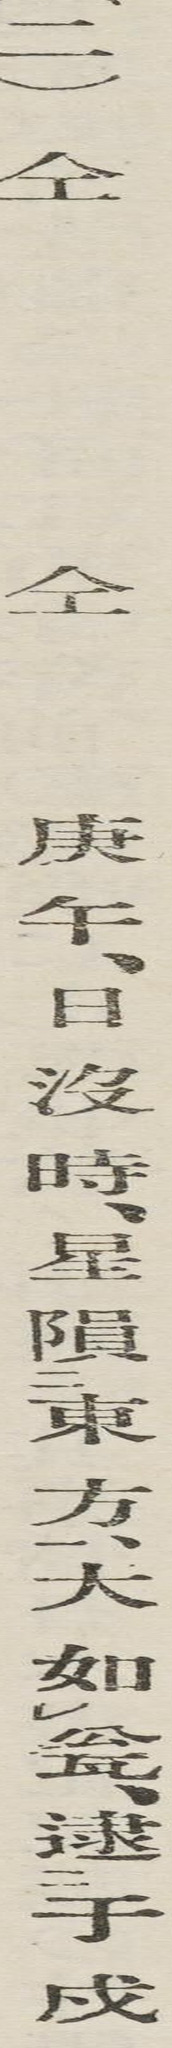同同庚午、日没時、星隕東方、大如瓮、逮于戌
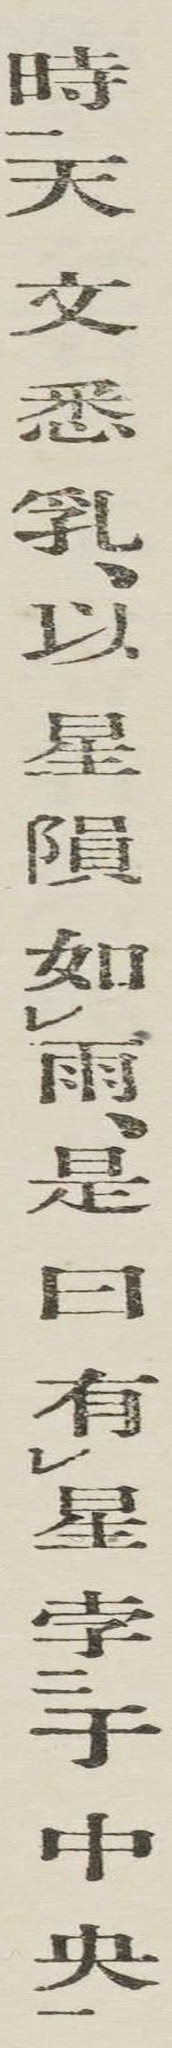時天文悉乳、以星隕如雨、是曰有星孛于中央
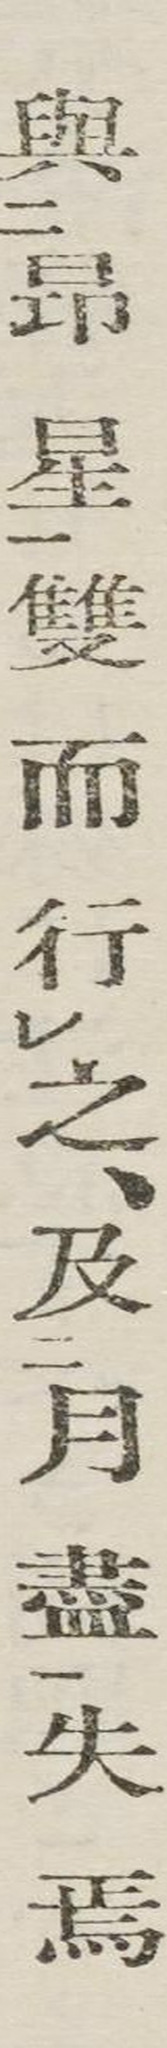与昴星双而行之、及月尽失焉
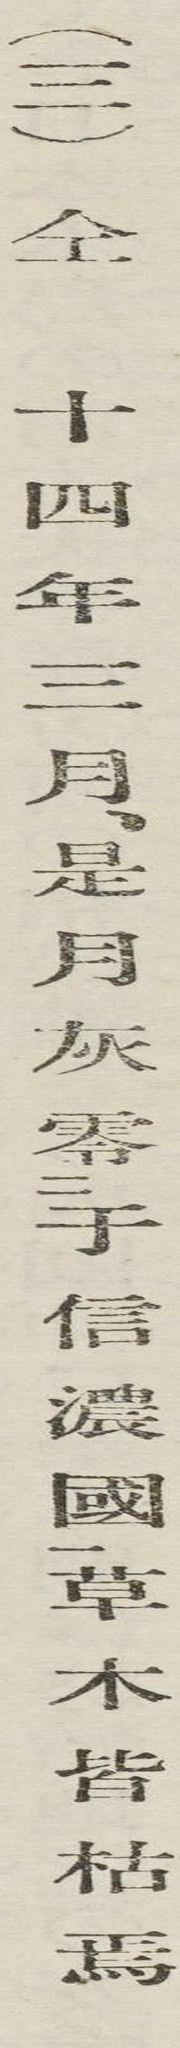同十四年三月、是月灰零于信濃国草木皆枯焉
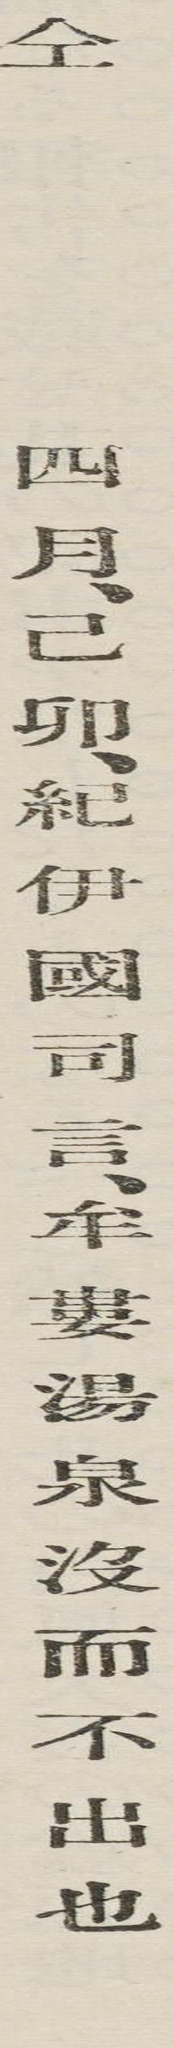同四月、己卯、紀伊国司言、牟婁湯泉没而不出也
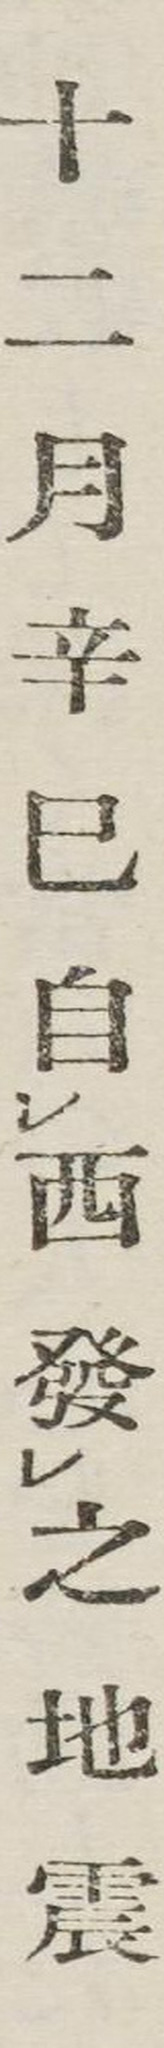同十二月辛巳自西発之地震
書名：土佐古今ノ地震
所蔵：東京大学地震研究所図書室 Earthquake Research Institute Library, The University of Tokyo, JAPAN
